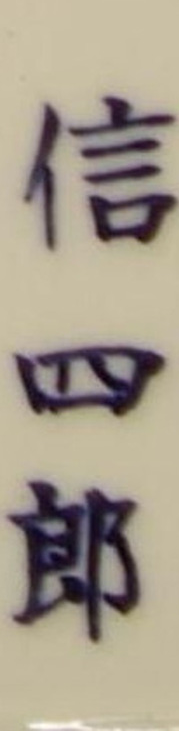信四郎
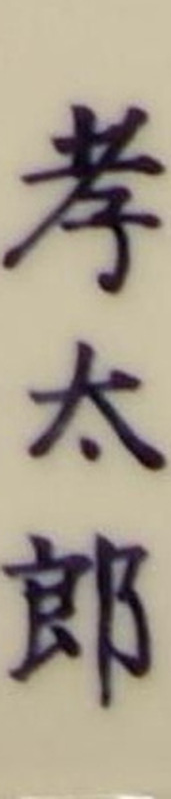孝太郎
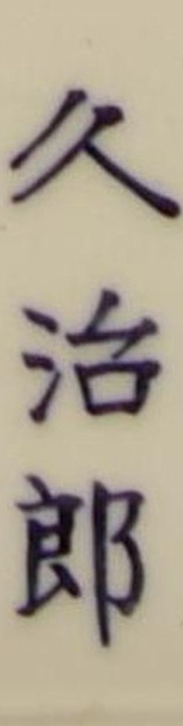久治郎
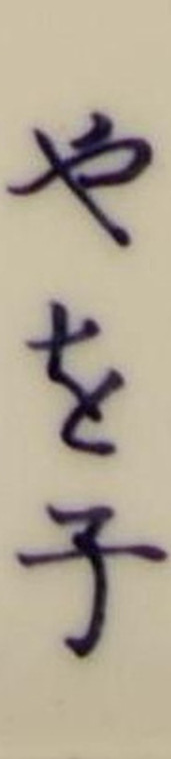やを子
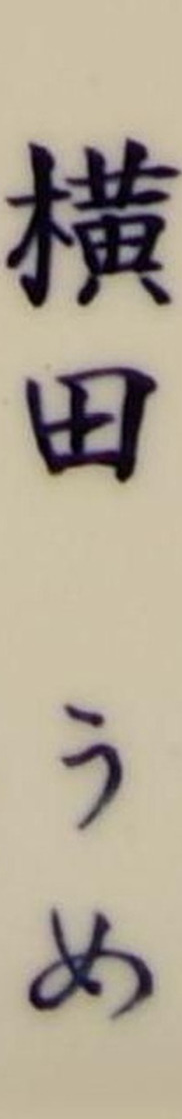横田うめ
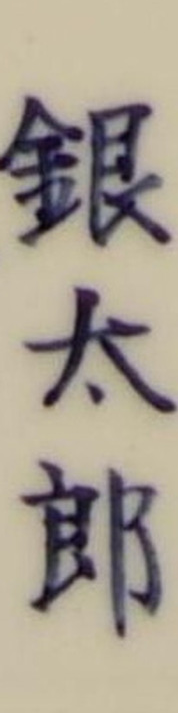銀太郎
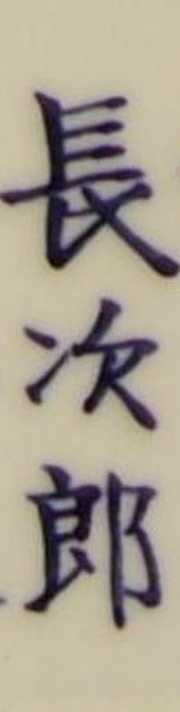長次郎
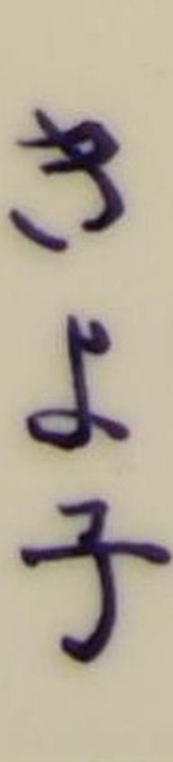きよ子
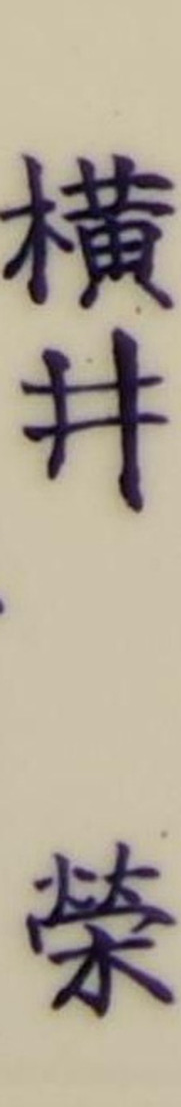横井榮
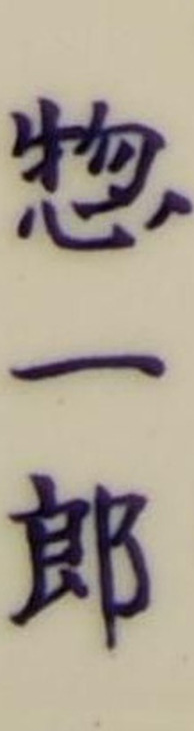惣一郎
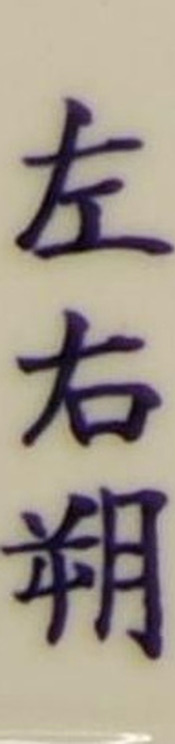左右朔

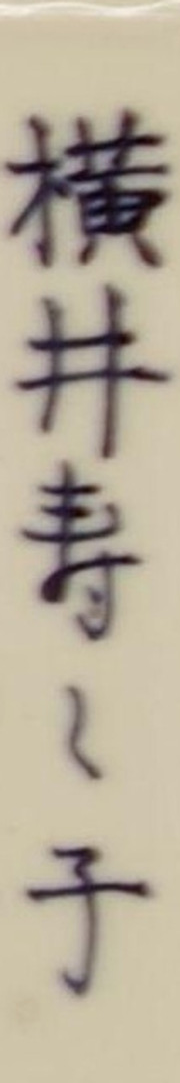横井すず子
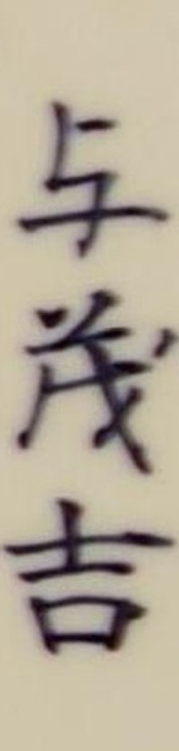与茂吉
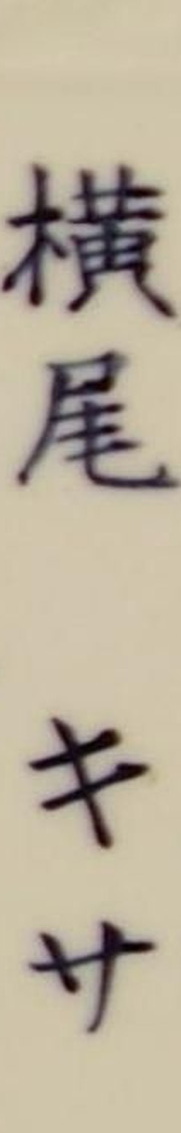横尾キサ
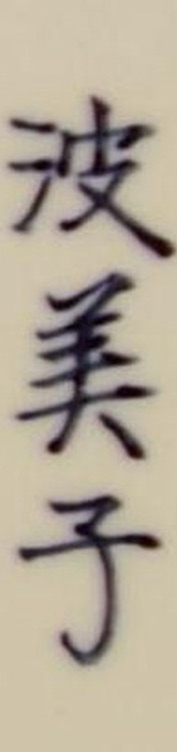波美子
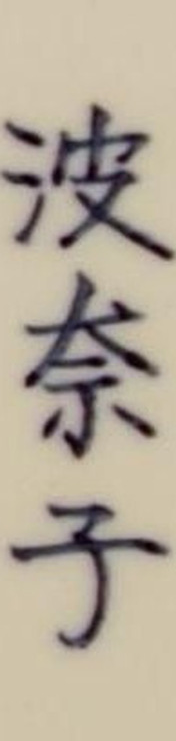波奈子
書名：A~D
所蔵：koyasan kongobuji
